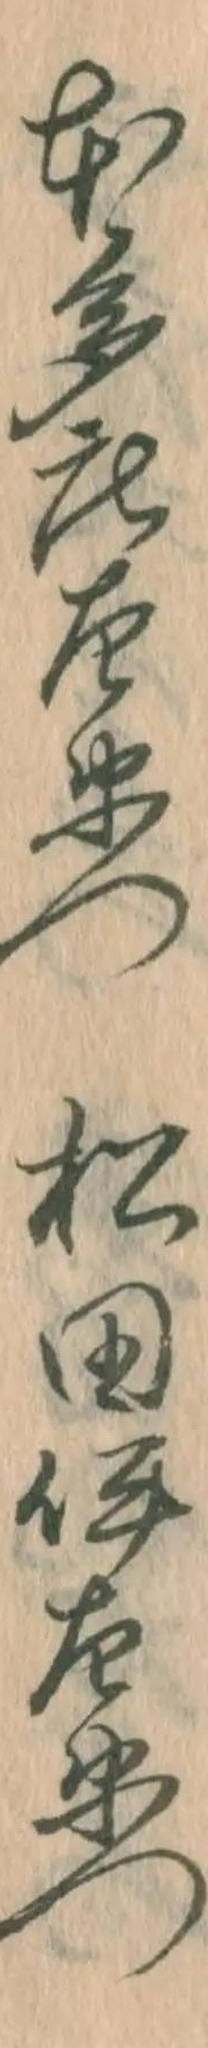本多庄左衛門松田伊左衛門荒木市郎左衛門
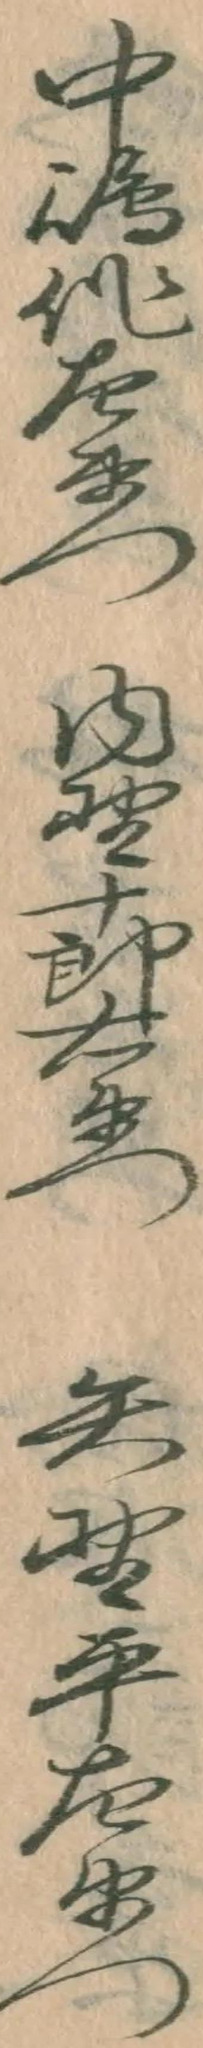中島作左衛門内野十郎右衛門矢野平左衛門
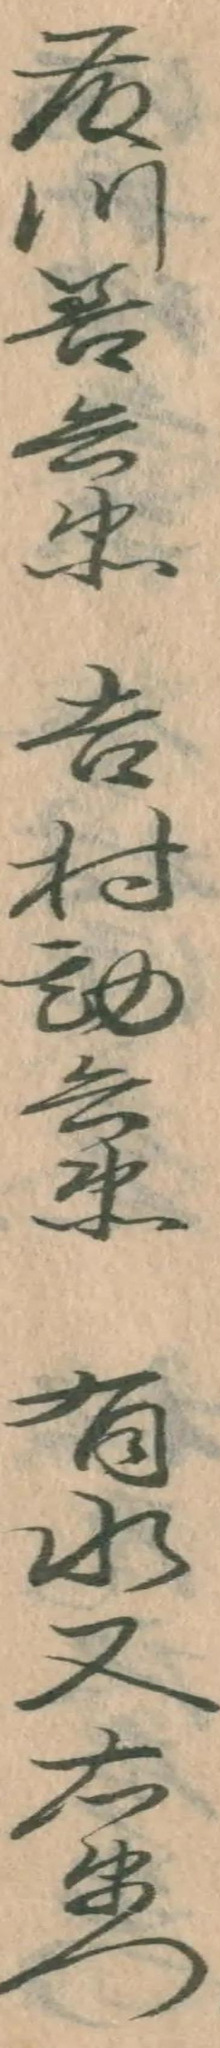藤川前兵衛吉村勘兵衛有水又右衛門
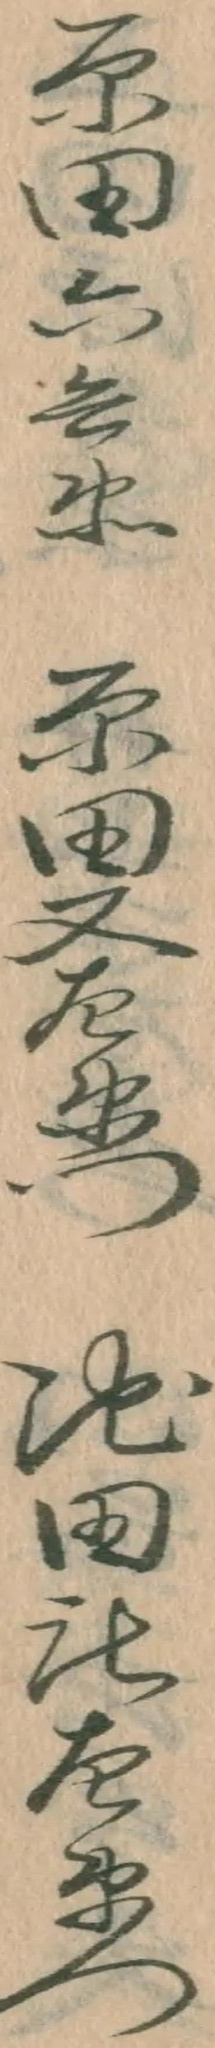原田六兵衛原田又左衛門池田庄左衛門
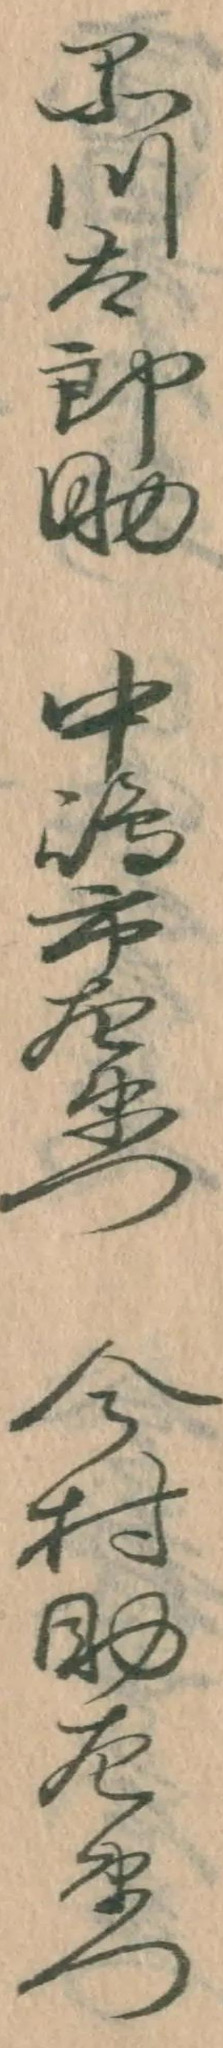早川太郎助中島市左衛門今村助左衛門
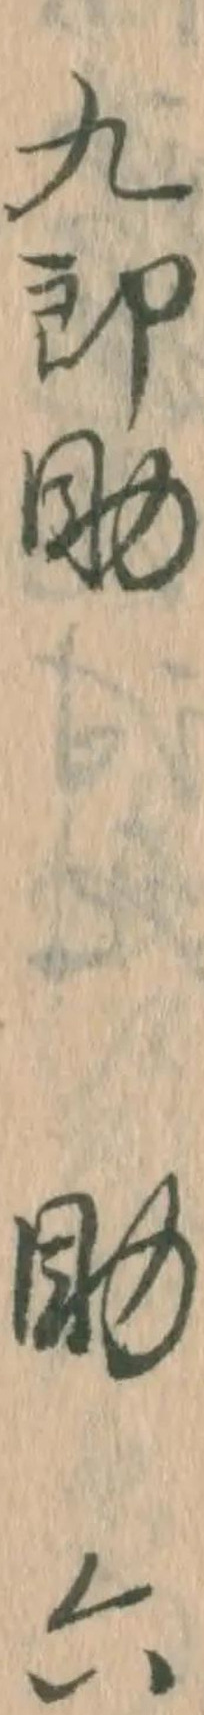九郎助助六
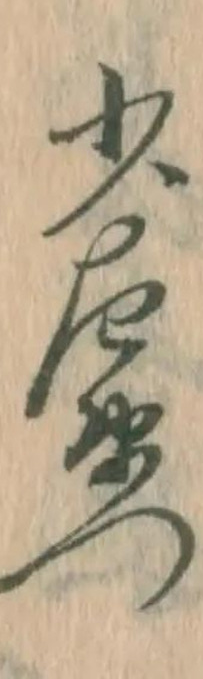庄左衛門
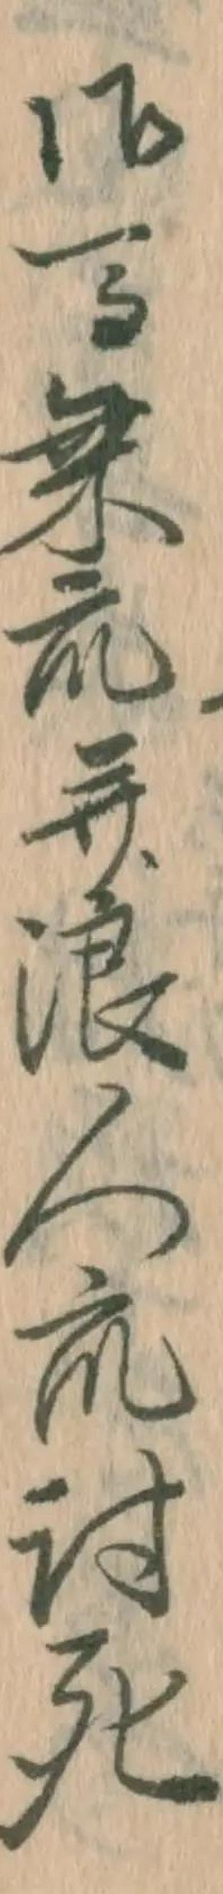御馬乗衆幷浪人衆討死
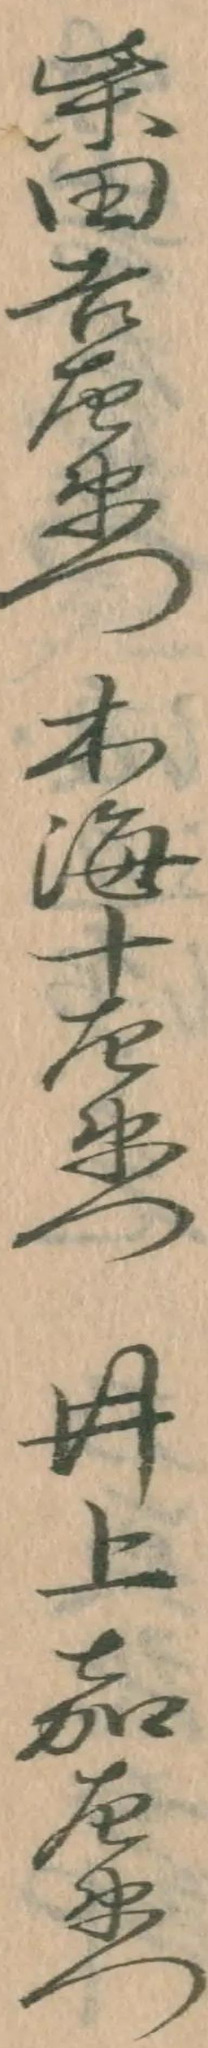柴田吉左衛門木海十左衛門井上嘉左衛門
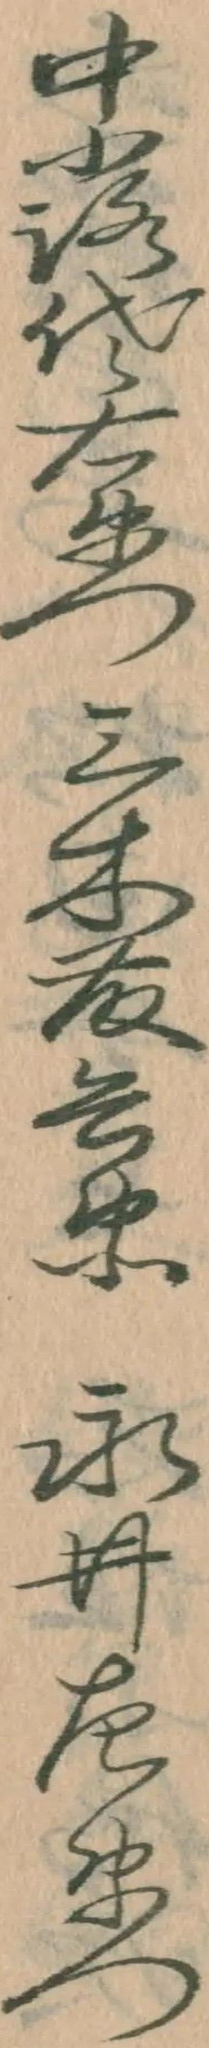中露佐右衛門三木藤兵衛永井左衛門
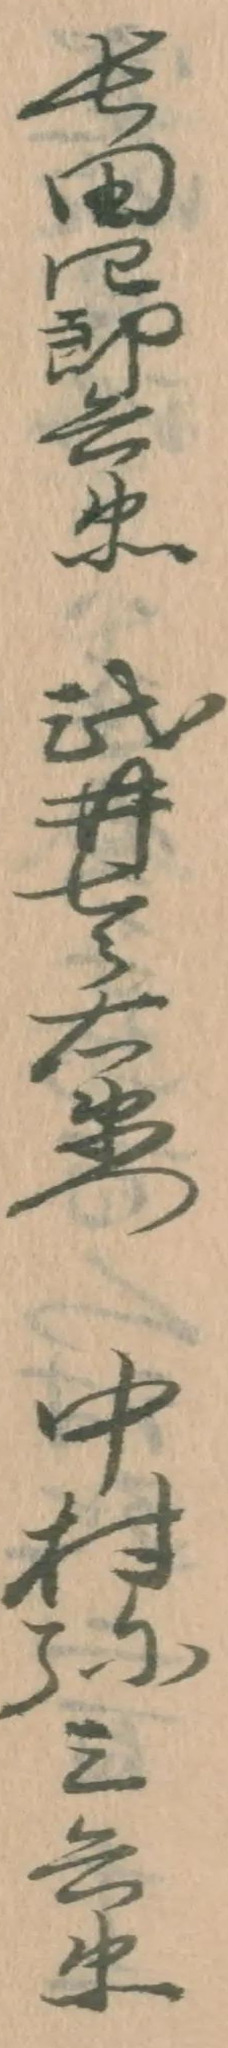長田四郎兵衛武井七郎右衛門中村弥三兵衛
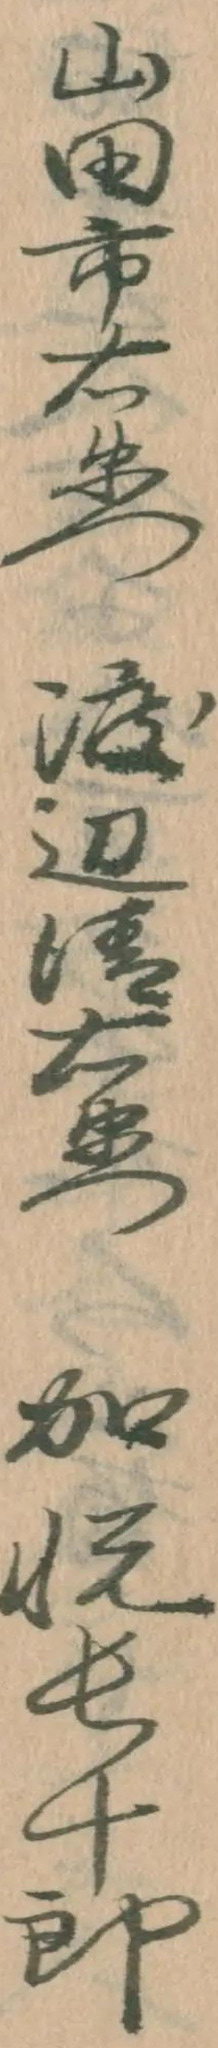山田市右衛門渡辺清右衛門加悦長十郎
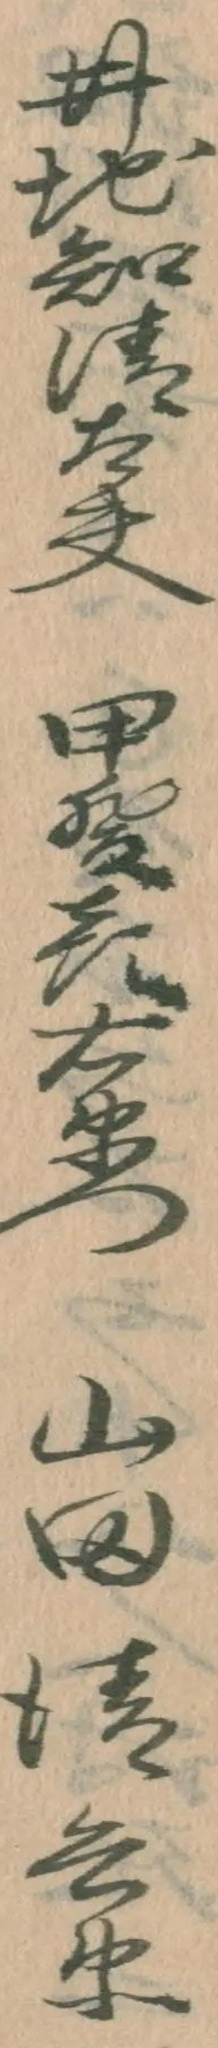井地知清太夫甲斐彦右衛門山田清兵衛
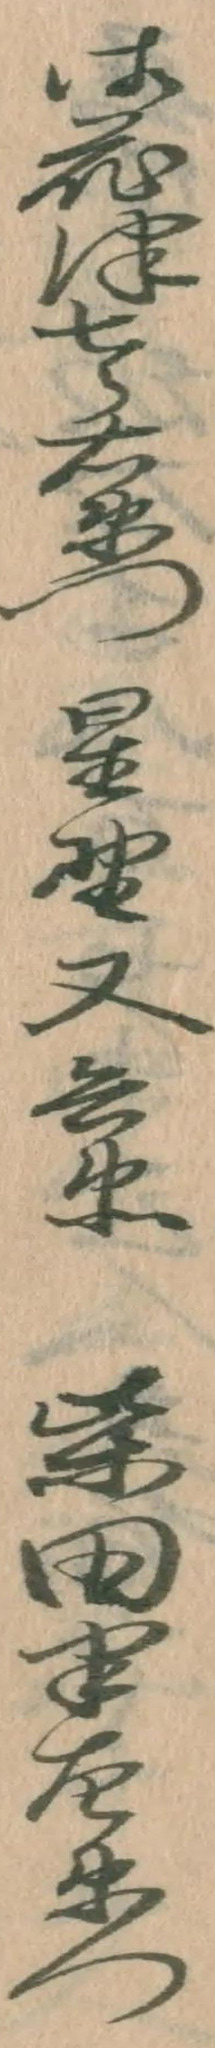御花津七郎右衛門星野又兵衛柴田半左衛門
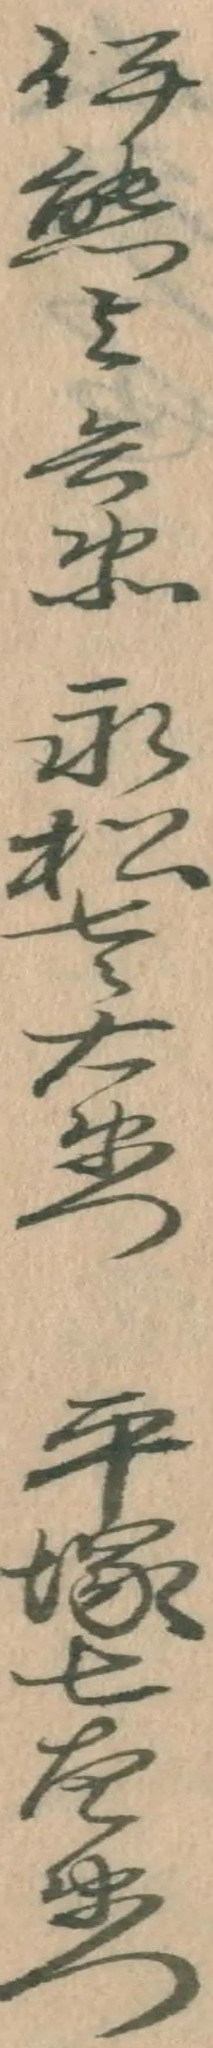伊熊与兵衛永松七郎右衛門平塚七左衛門
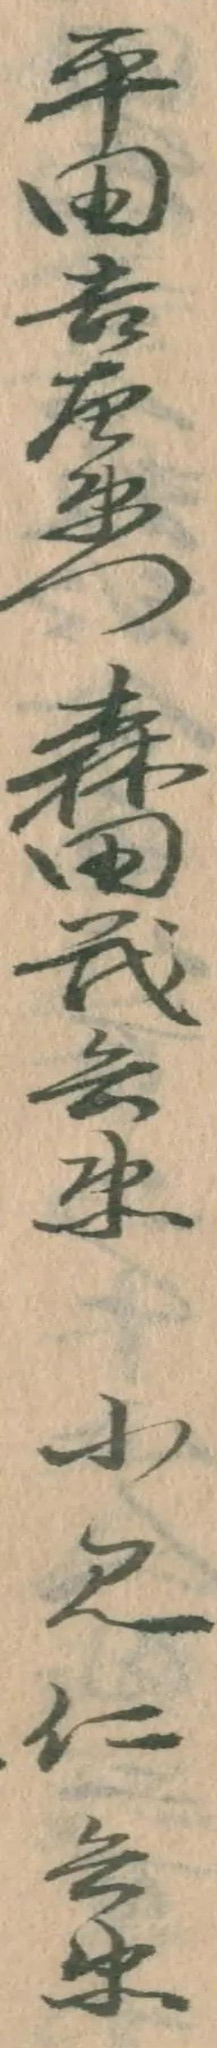平田吉左衛門森田茂兵衛小見仁兵衛
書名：切支丹御退治記 49巻. [9]
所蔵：国立国会図書館 National Diet Library, JAPAN
